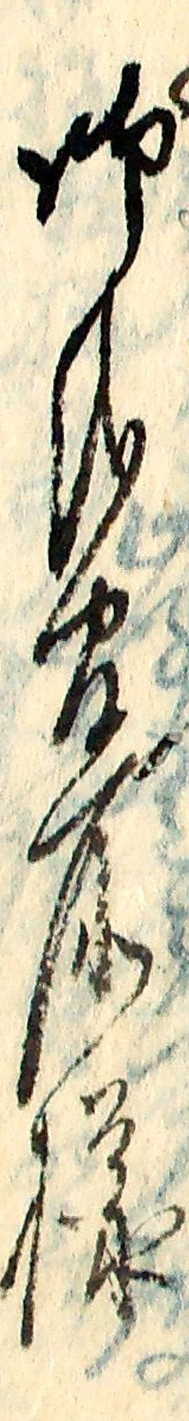御代官所様

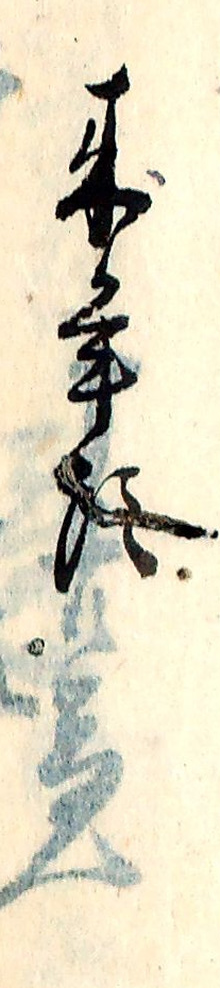来年頭
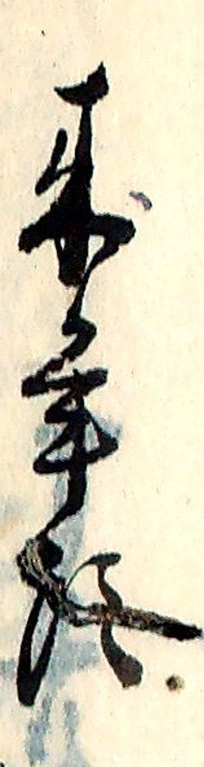来年頭
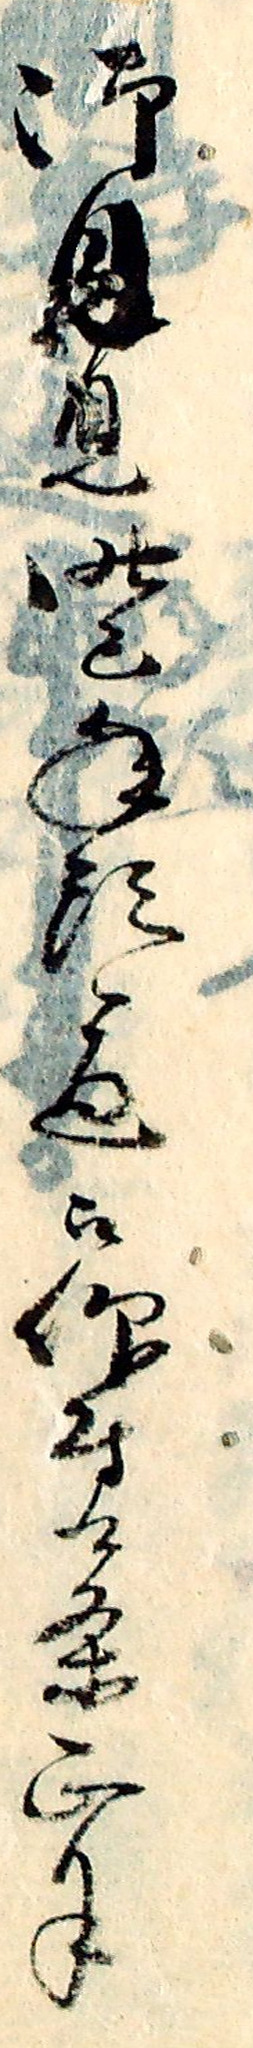御目見昨巳年頭之通被仰付候条正月
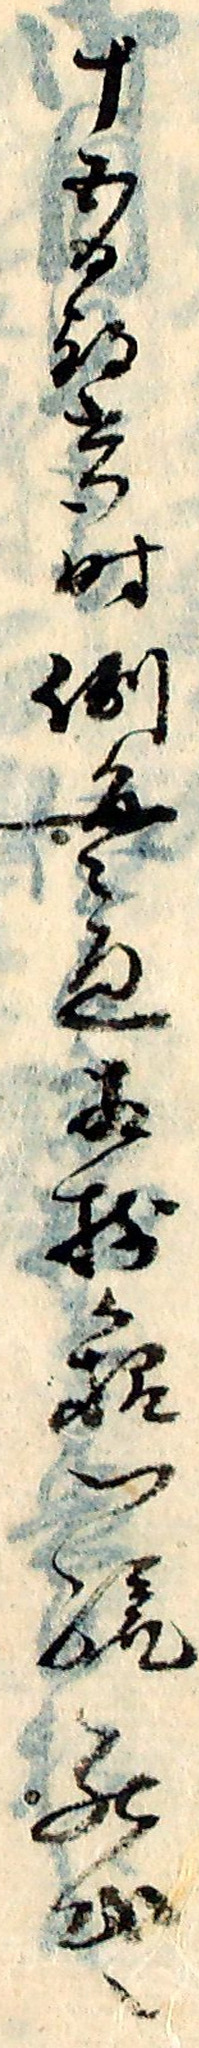十五日朝六つ時例毎之通相揃候様一統罷出之
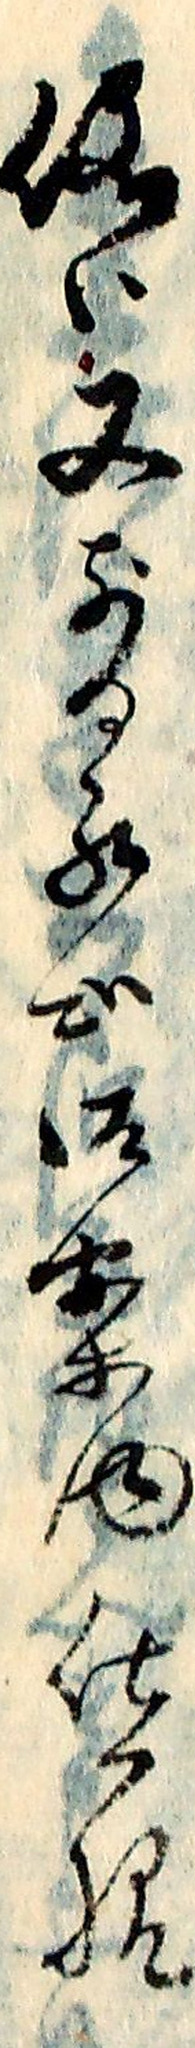儀は又前日罷出御案内仕候様
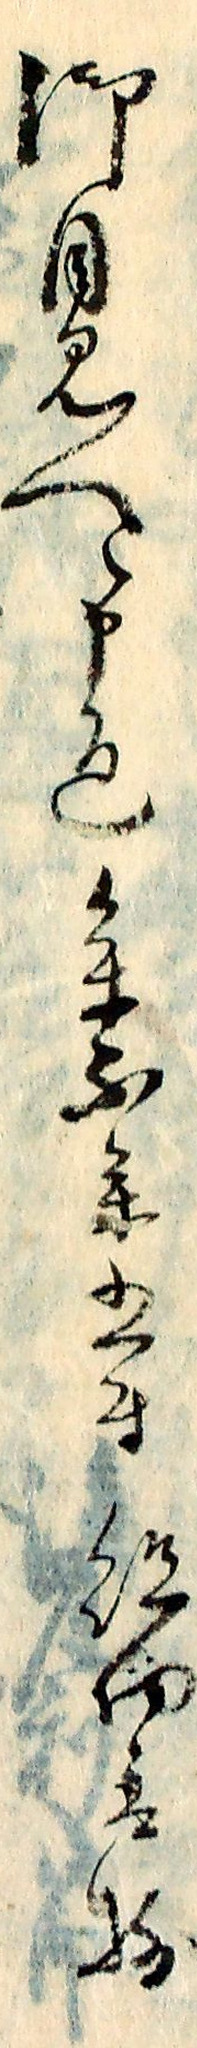御目見可申通参不参書付組切取揃
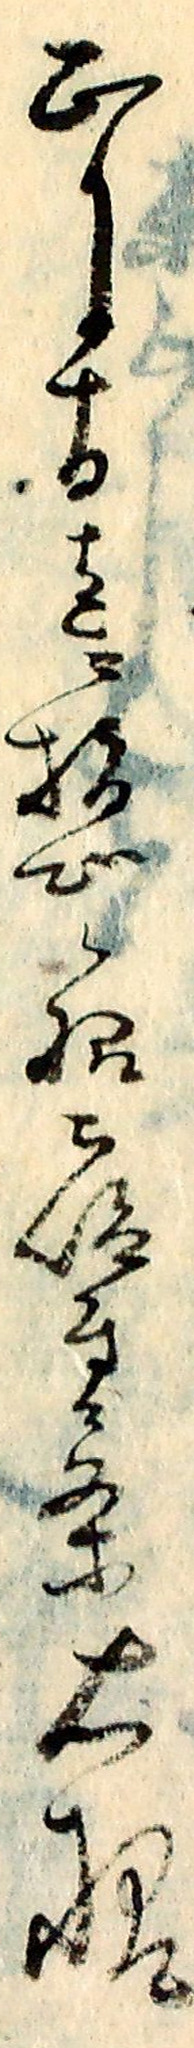正月十日迄に指出候様被仰付候条右様
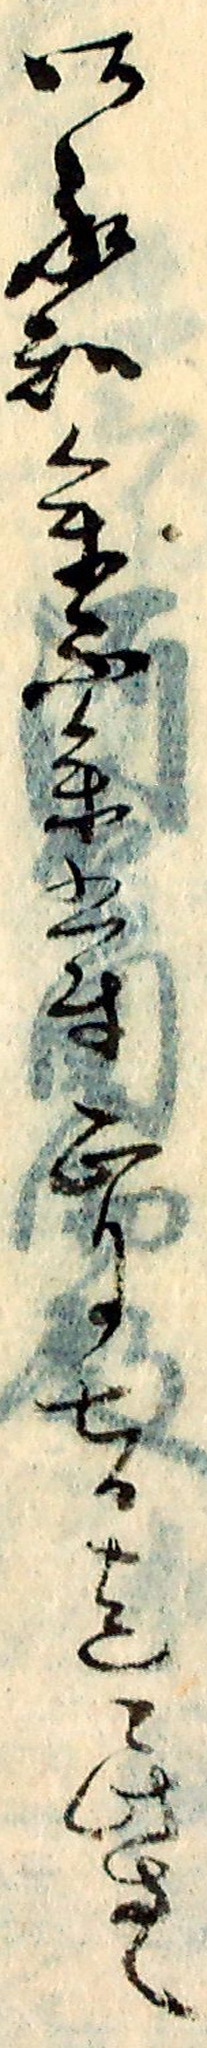御承知参不参書付正月七日迄に此方へ
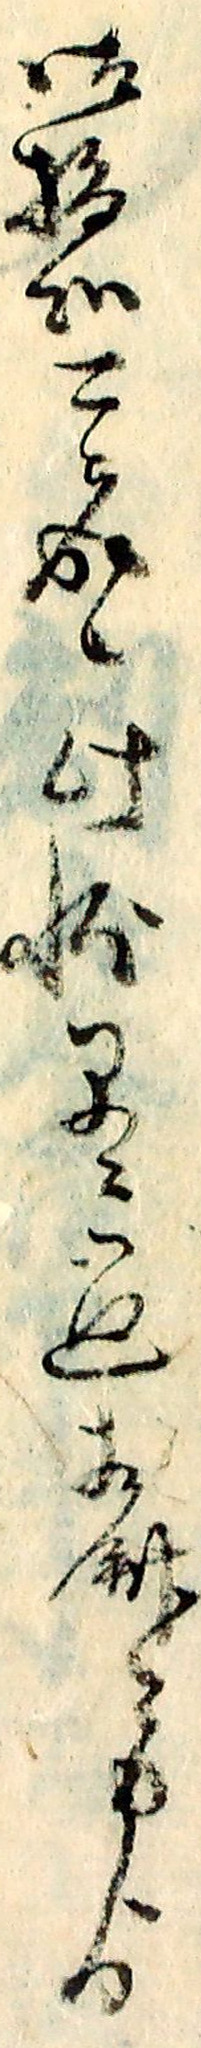御指出可被成候此状早々御廻相済候方ゟ
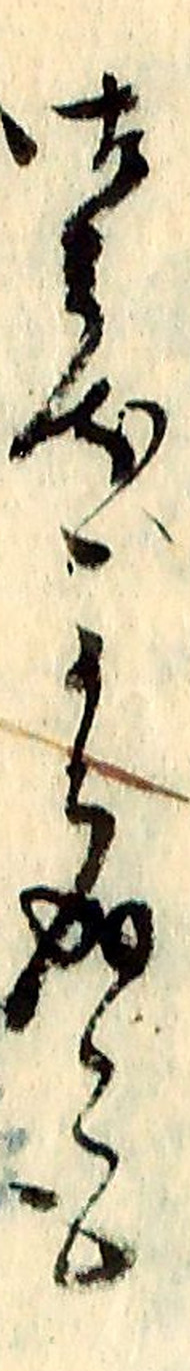御戻可被成候以上
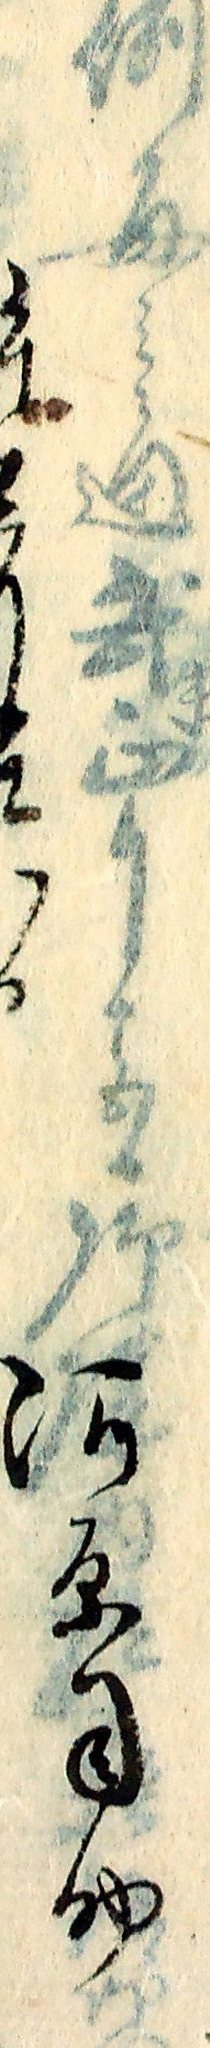河原周助
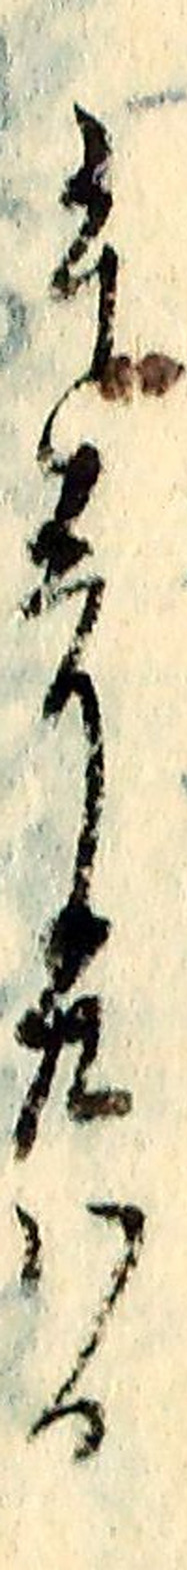午十二月廿八日
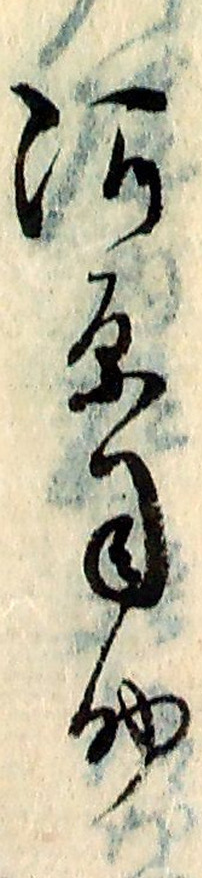河原周助
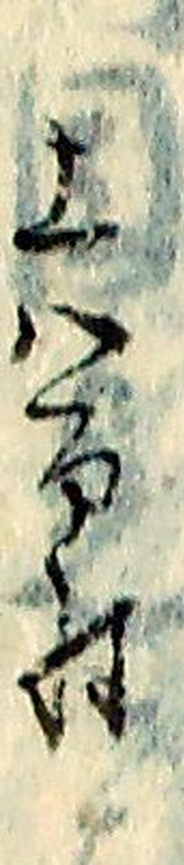上八万村
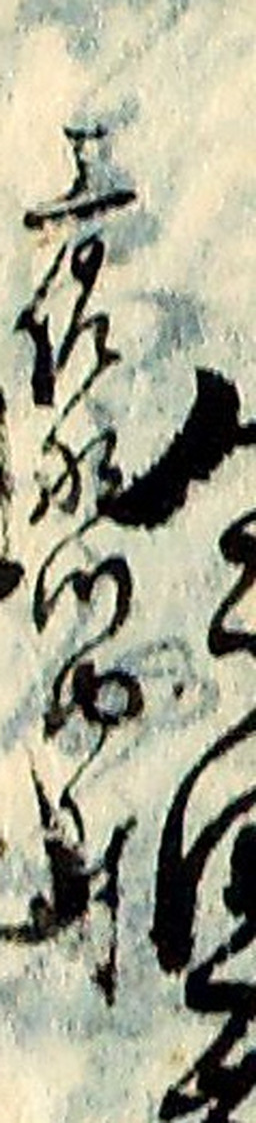上佐那川内村
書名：諸御願書控(後藤氏壱番）
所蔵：鳴門教育大学 Naruto University of Education
